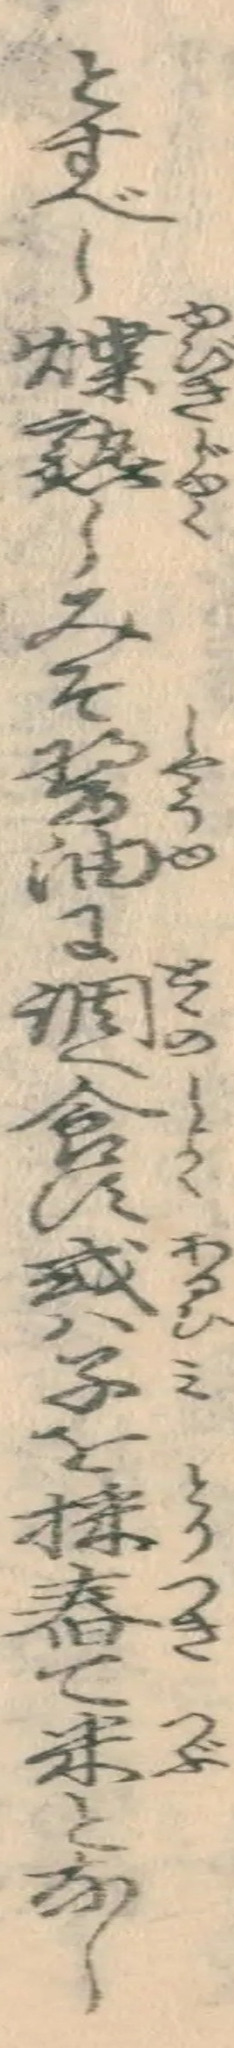とすべし煠熟しみそ醤油に調へ食す或は子を採舂て米となし
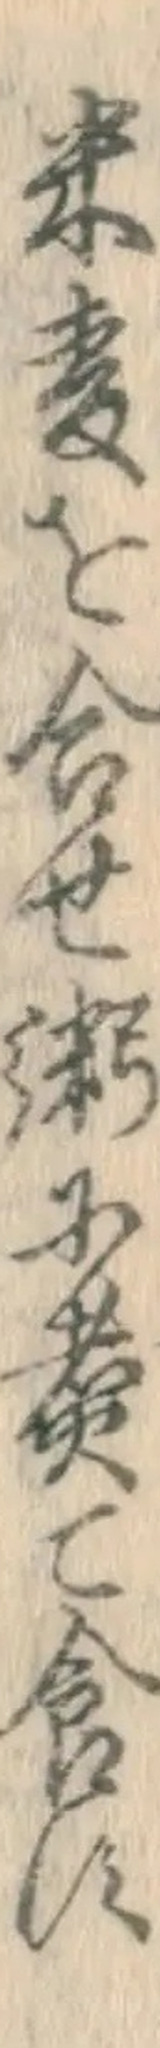米麦を合せ粥に煑て食す
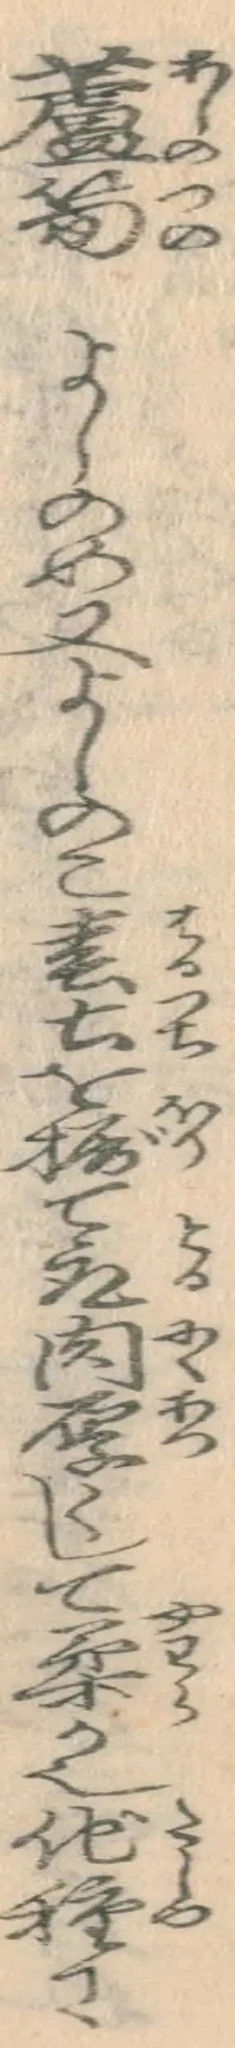蘆筍よしのめ又よしのこ春土を掘て取肉厚くして柔か也他種に
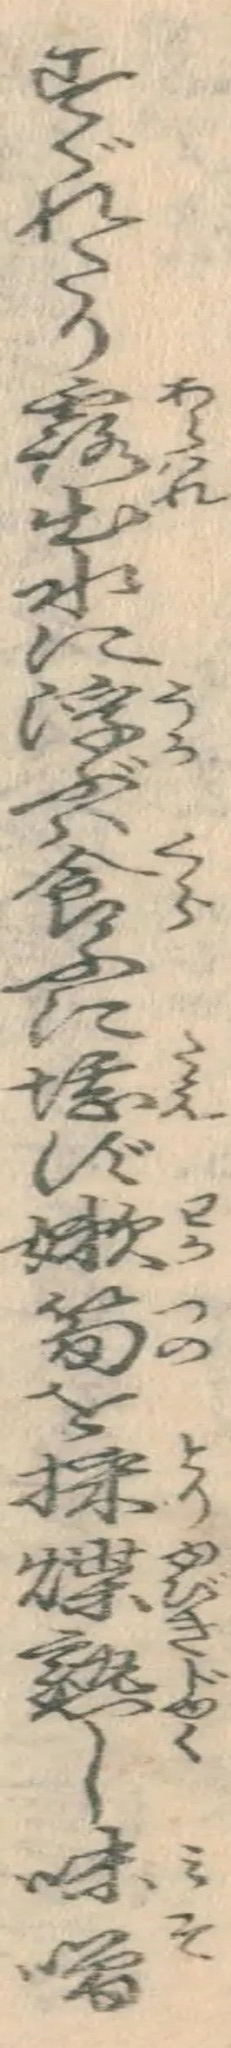すぐれたり露出水に浮ぶは食ふに堪ず嫰筍を採煠熟し味噌
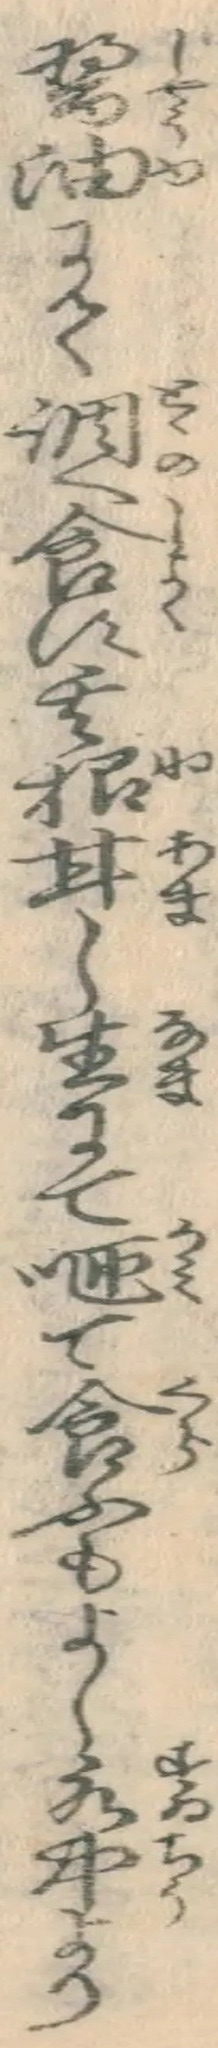醤油にて調へ食す其根甘し生にて咂て食ふもよし水中より
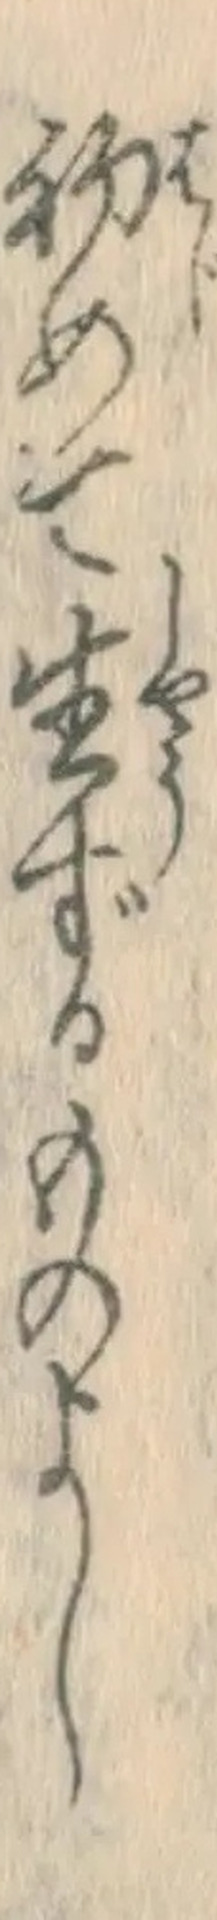初めて生ずるものよし
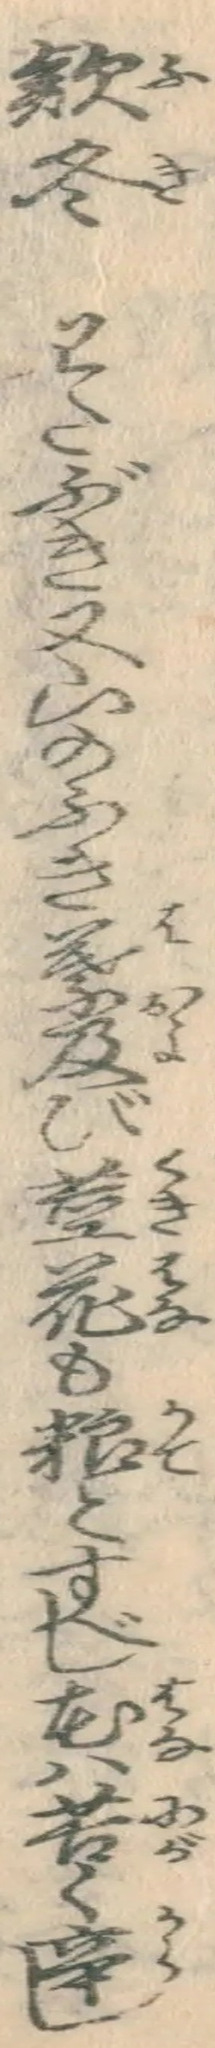欵冬わたぶき又山のふき葉及び茎花も粮とすべし花は苦く辛し
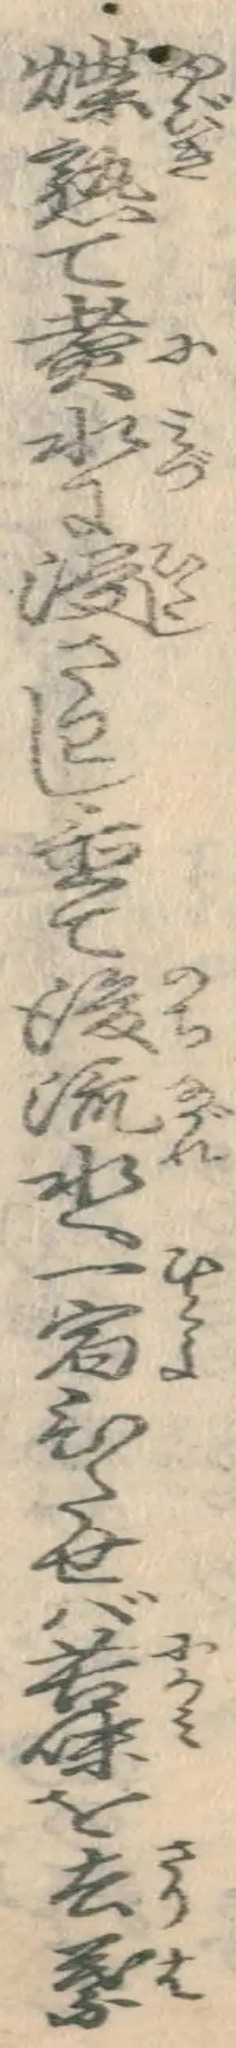煠熟て煑水に浸さわし置て後流水へ一宿ひたせば苦味を去葉
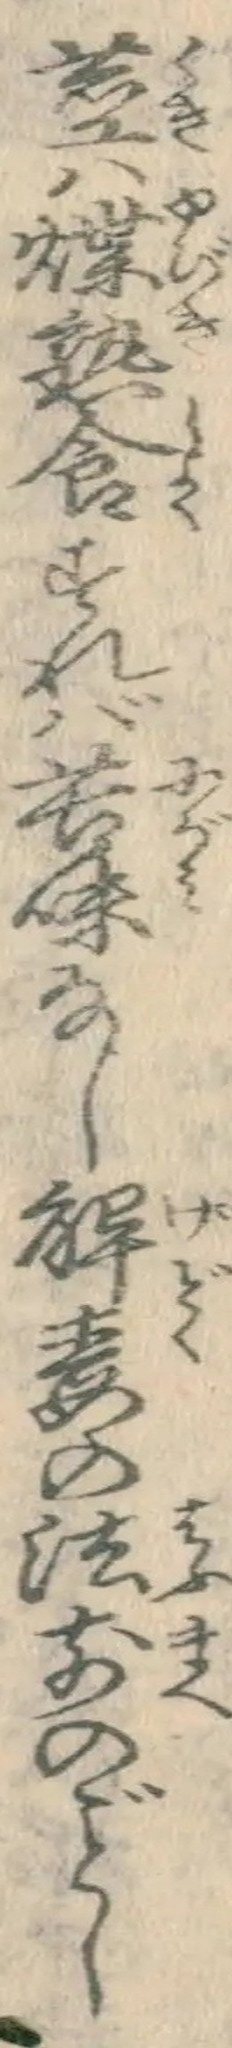茎は煠熟食すれば苦味なし解毒の法前のごとし

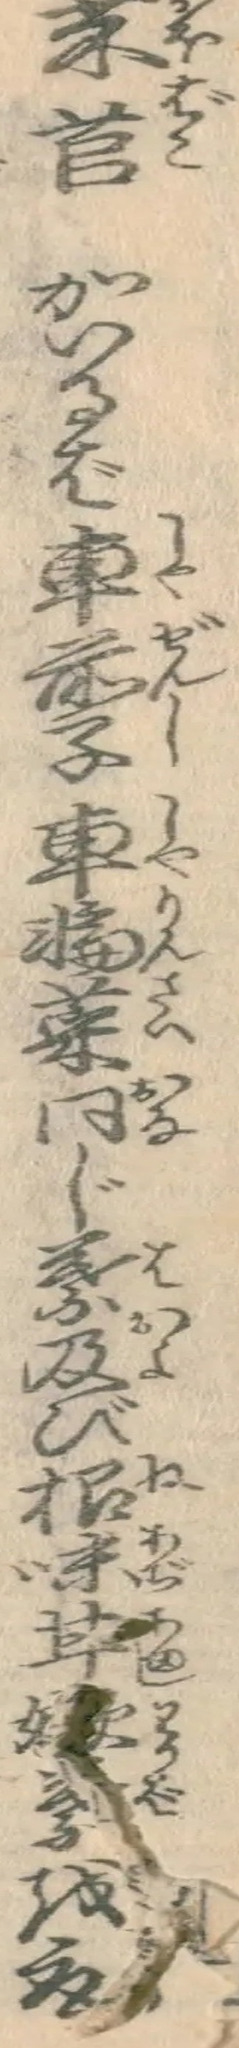芣苢かいるば車前子車輪菜同じ葉及び根味甘嫰葉を取
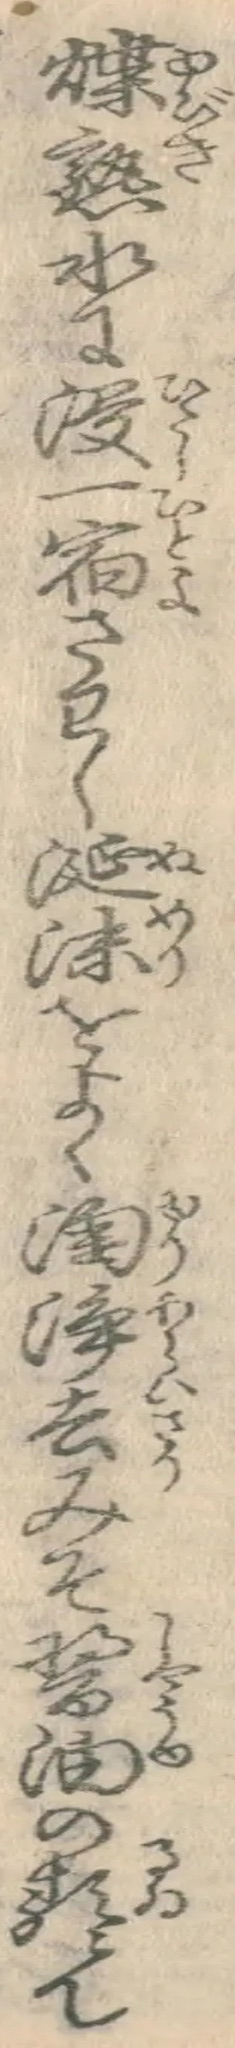煠熟水に浸一宿さわし涎沫をよく淘浄去みそ醤油の類にて
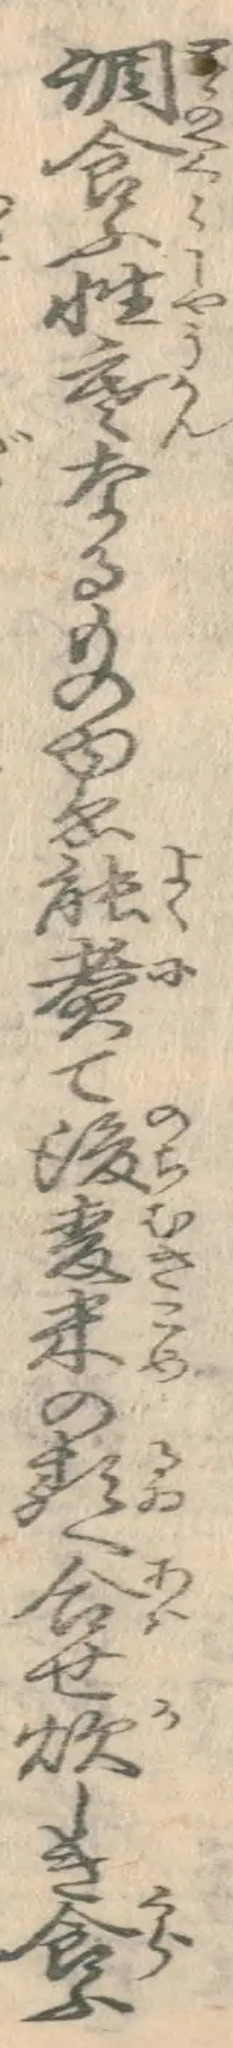調食ふ性寒なるものゆゑ能煑て後麦米の類へ合せ炊しき食ふ
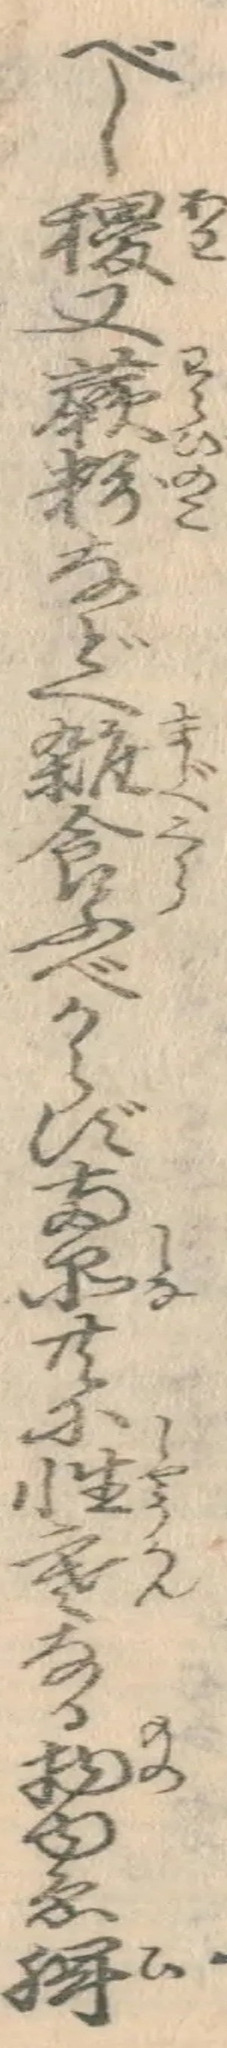べし稷又蕨粉などへ雑食ふべからず両品共に性寒なる物ゆゑ脾
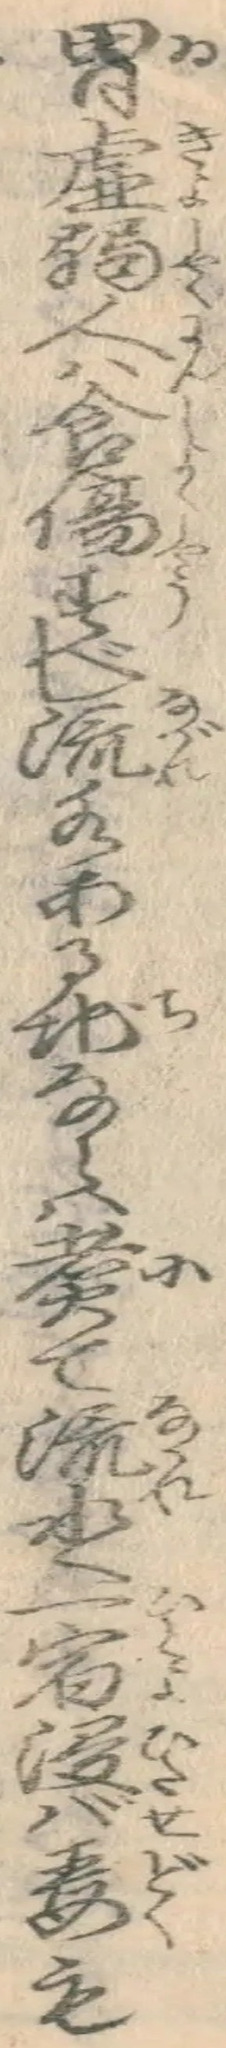胃虚弱人は食傷すべし流水ある地ならは煑て流水へ一宿浸ば毒も
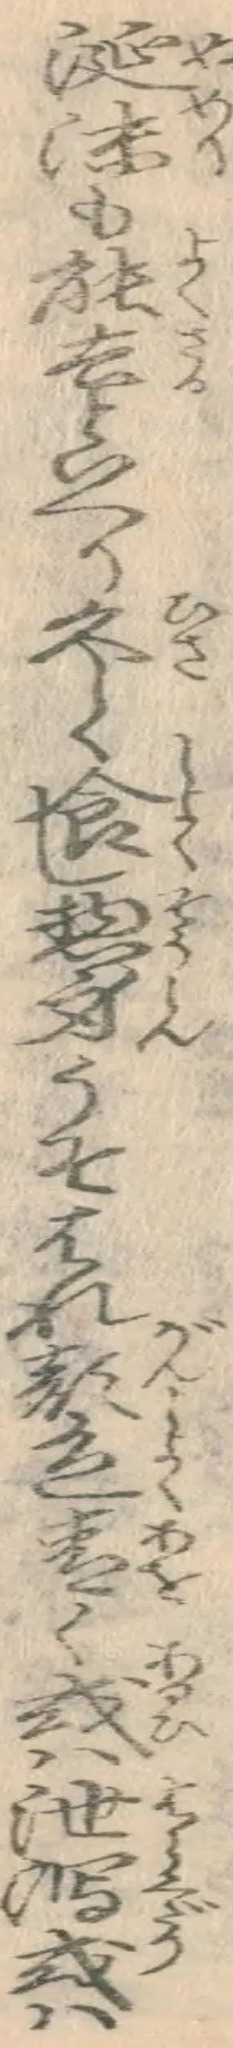涎沫も能去といへり久しく食し惣身うそはれ顔色青く或は泄瀉或は
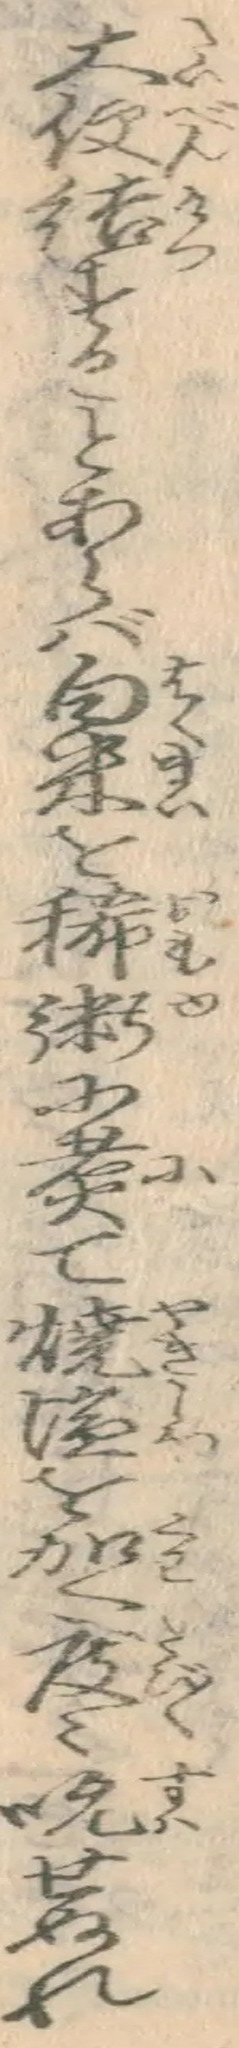大便結することあらば白米を稀粥に煑て焼塩を加へ度々吮せぬれ
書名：経済をしへ草
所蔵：国立国会図書館 National Diet Library, JAPAN
